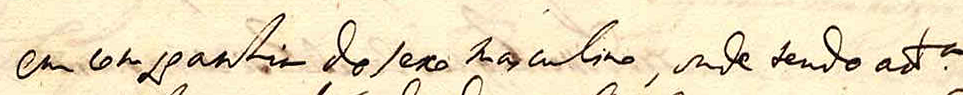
em companhia do sexo masculino, onde tendo a d̄.a
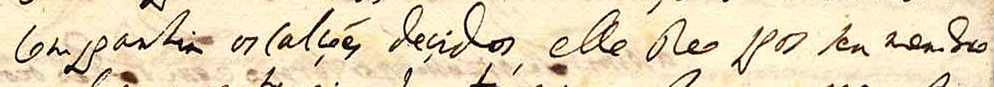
companhia os calçoẽs decidos, elle Reo pos seu membro
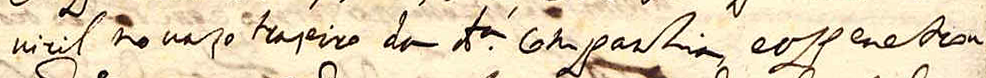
uiril no uazo trazeiro da d̄a companhia, e o penetrou
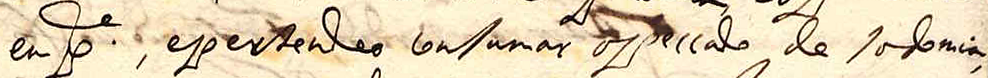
em p̄.e, e pertendeo consumar o peccado de sodomia,
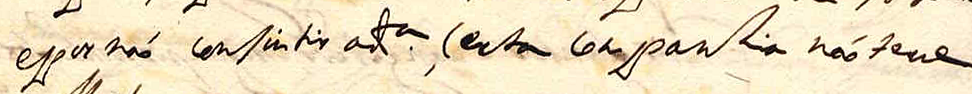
e por naõ consintir a d̄a. certa companhia naõ teue
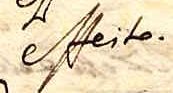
effeito.
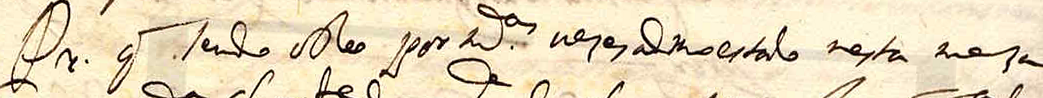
Pr. q̄ sendo o Reo por m.tas uezes admoestado nesta meza
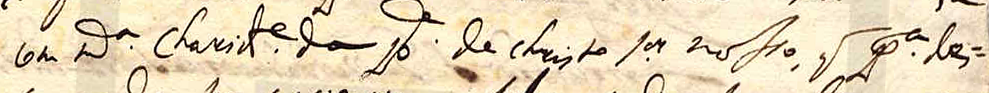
com m̄.a charid̄.e da p.te de christo s.or nosso, q̄ p.a des
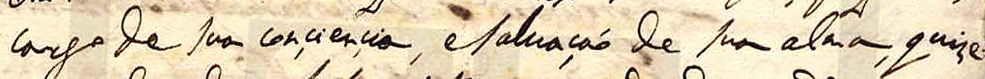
cargo de sua conciencia, e saluaçaõ de sua alma, quize
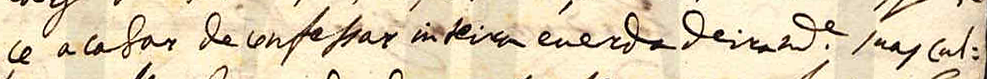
ce acabar de confessar inteira e uerdadeiram.te suas cul
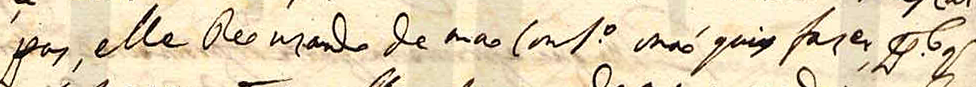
pas, elle Reo uzando de mao cons.o o naõ quis fazer, p.lo q̄
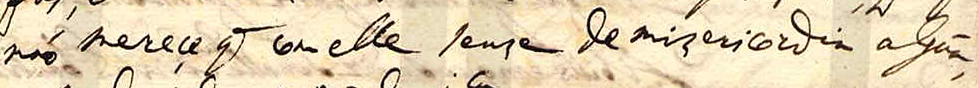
naõ mereçe q̄ com elle se uze de mizericordia alguā
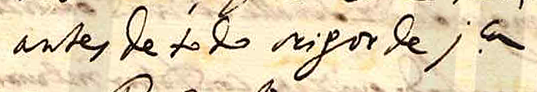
antes de todo o rigor de j.ca
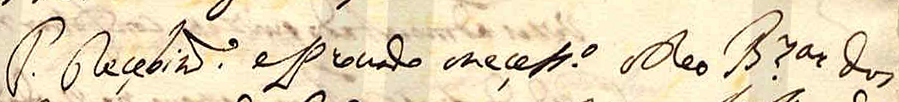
P. Recebim.o e prouado o necess.o o Reo B.zar dos
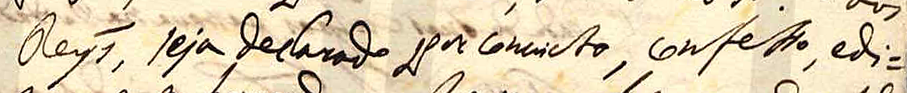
Reys, seja declarado por conuicto, confesso, e di
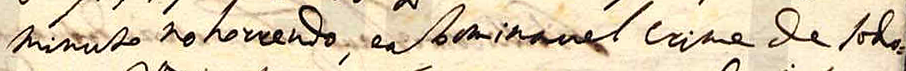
minuto no horrendo, e abominauel crime de sodo
